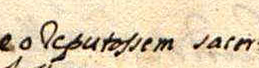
e o Reputassem sacer
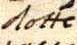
dotte
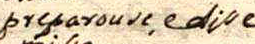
preparouse, e disse
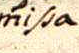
missa
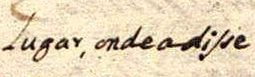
Lugar, onde a disse
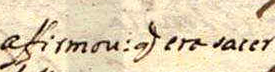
affirmou: q̄ era sacer
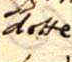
dotte
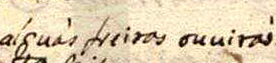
alguās freiras ouuiraõ
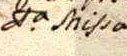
d̄.a missa.
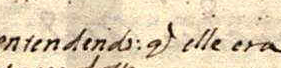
entendendo: q̄ elle era
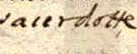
sacerdotte
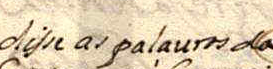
disse as palauras da
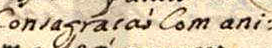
Consagraçaõ com ani
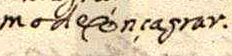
mo de Conçagrar.
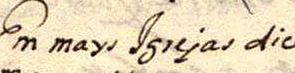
Em mays Igrejas dice
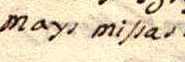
mays missas.
